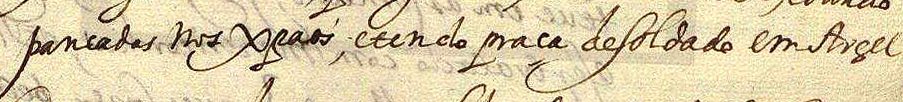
pancadas nos xpaõs, e tendo praça de Soldado em Argel
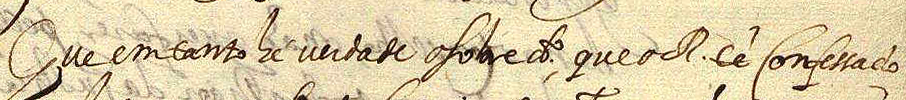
Que em tanto he uerdade o sobred̄.o, que o R. tē Confessado
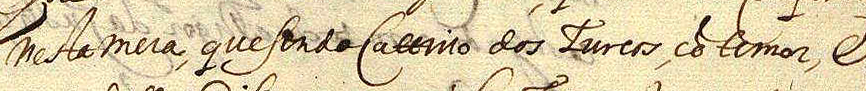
nesta meza, que Sendo Cattiuo dos Turcos, cō temor, e
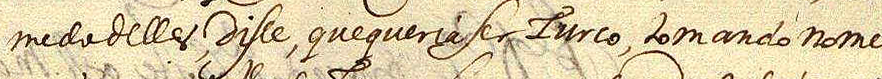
medo delles, disse, que queria Ser Turco, tomando nome
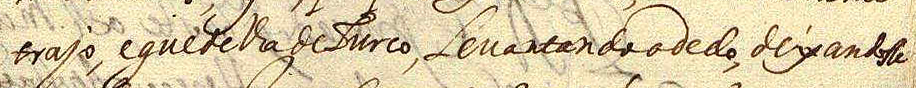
trajo, e guedelha de Turco, Leuantando o dedo, deixandosse
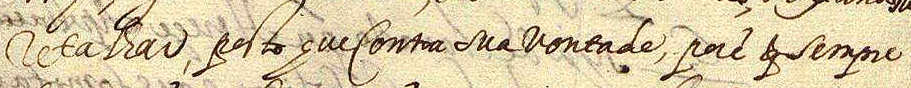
retalhar, posto que Contra sua vontade, porē q̄ sempre
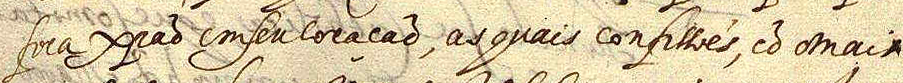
fora xpaõ em Seu coraçaõ, as quais confissoẽs, cō o mais
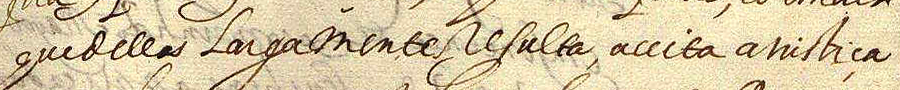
que della Largamente resulta, aceita a iustiça
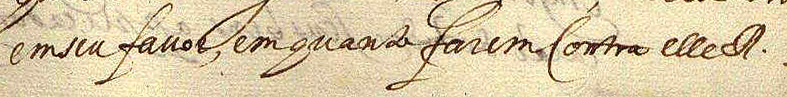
em seu fauor, emquanto fazem Contra elle R.
